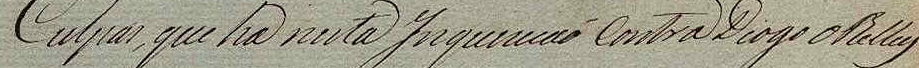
Culpas, que ha nesta Jnquisicaõ Contra Diogo ORelley
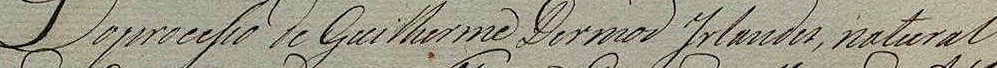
Do processo de Guilherme Dermos Jrlandes, natural
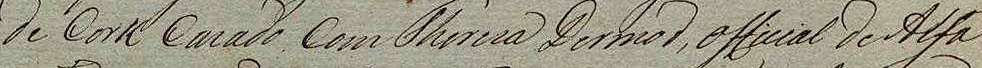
de Cork Cazado Com Thereza Dermos, official de Alfa
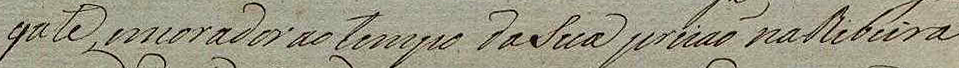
yate, morador ao tempo da Sua prisaõ na Ribeira
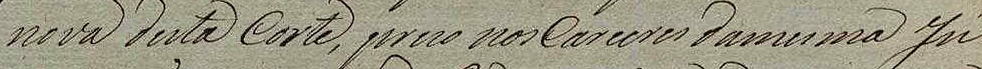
nova desta Corte, preso nos Carceres da mesma Jn
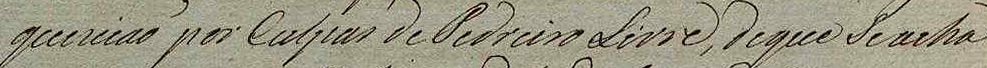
quisicaõ por Culpas de Pedreiro Livre, de que Se acha
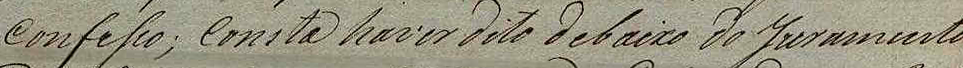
confesso. consta haver dito debaixo do Juramento
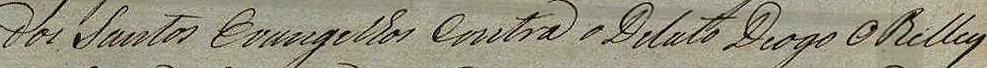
dos Santos Evangelhos Contra o Delato Diogo ORelley
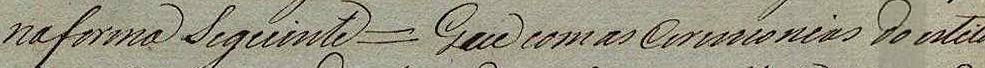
na forma Seguinte= Que com as ceremonias do estilo
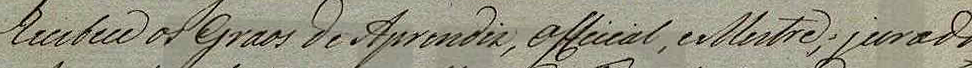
Recebeu os Graos de Aprendiz, official, e Mestre, jurado,
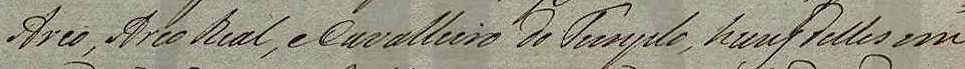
Arco, Arco Real, e Cavalleiro do Templo, huns delles em
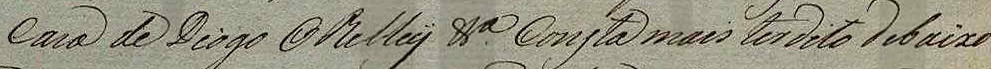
Caza de Diogo ORelley &a. Consta mais ter dito debaixo
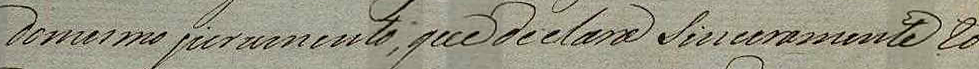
do mesmo juramento, que declara Sinceramente to
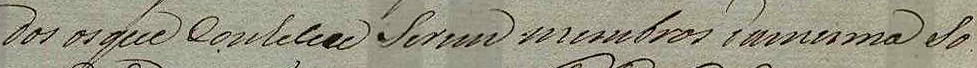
dos os que conheceu Serem membros da mesma So
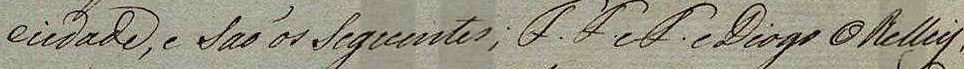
ciedade, e Saõ os Seguintes; F. F. e F. Diogo ORelley
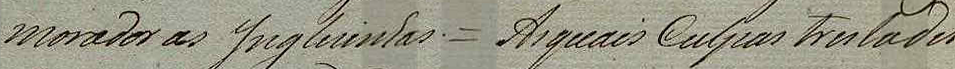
morador as Jnglesinhas = As quais Culpas tresladei
